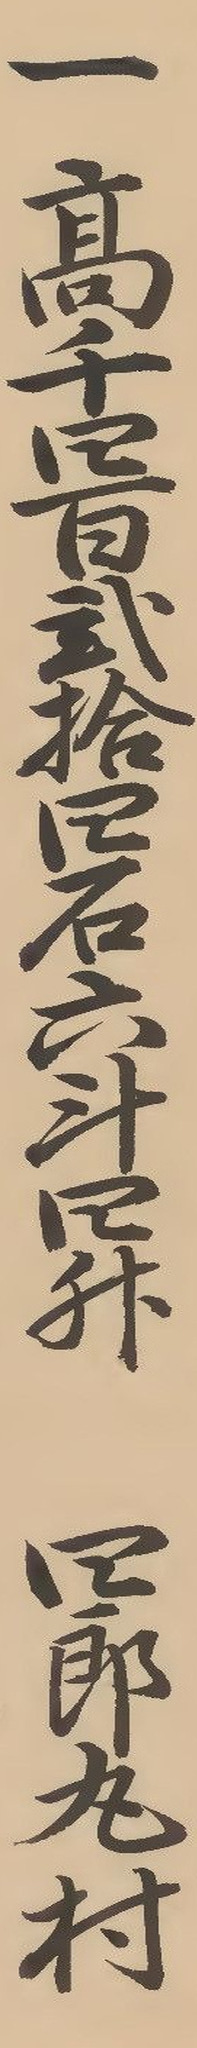一高千四百弐拾四石六斗四升四郎丸村
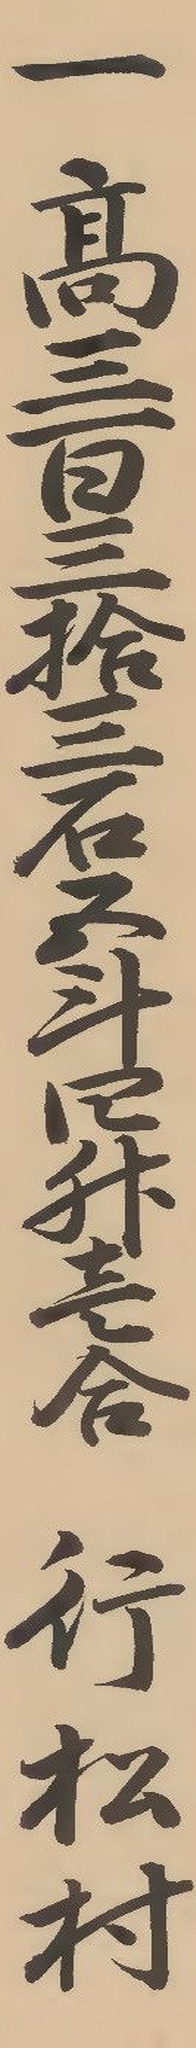一高三百三拾三石五斗四升壱合行松村
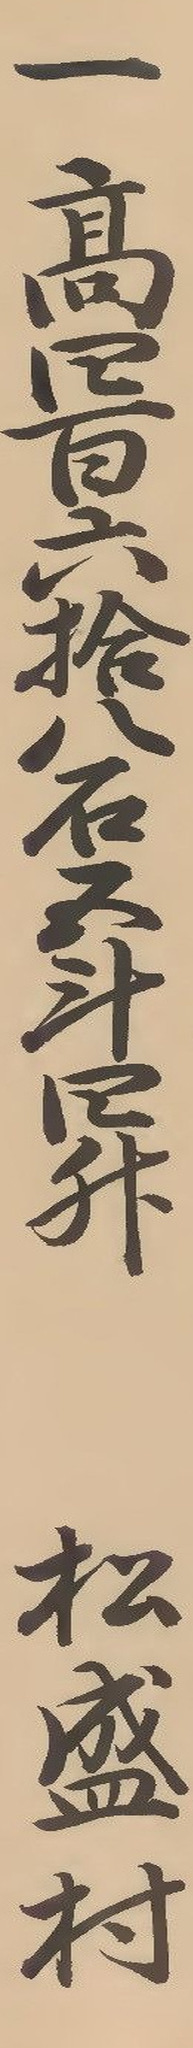一高四百六拾八石五斗四升松盛村
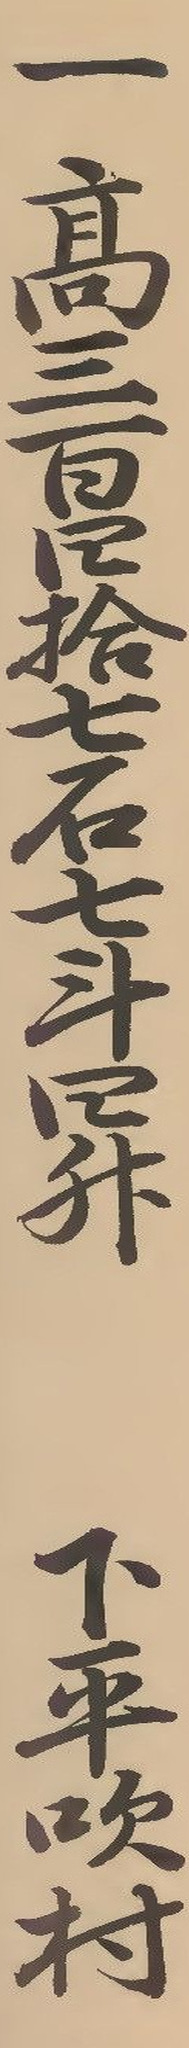一高三百四拾七石七斗四升下平吹村
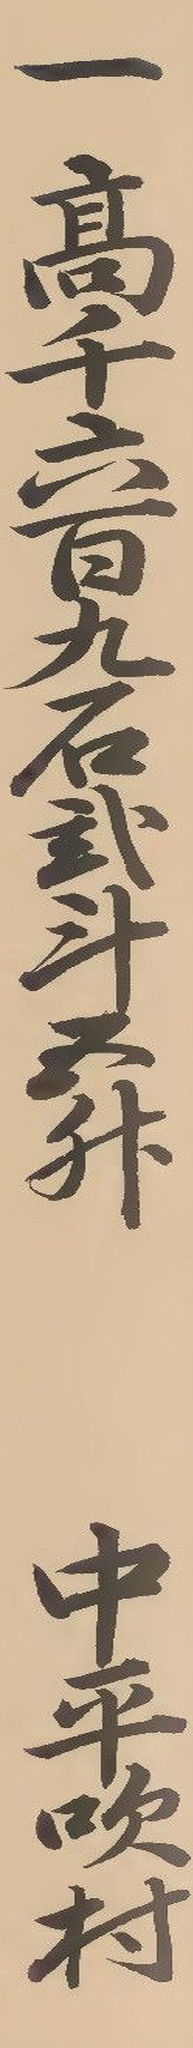一高千六百九石弐斗五升中平吹村
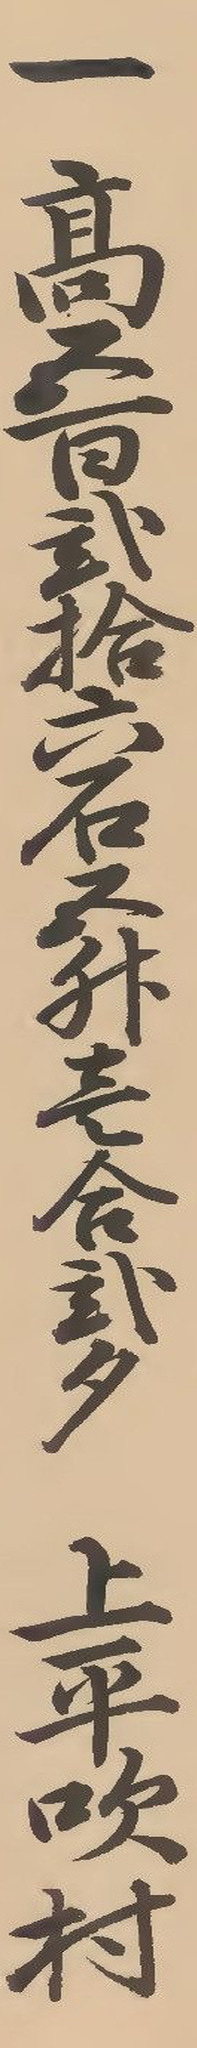一高五百弐拾六石五升壱合弐勺上平吹村
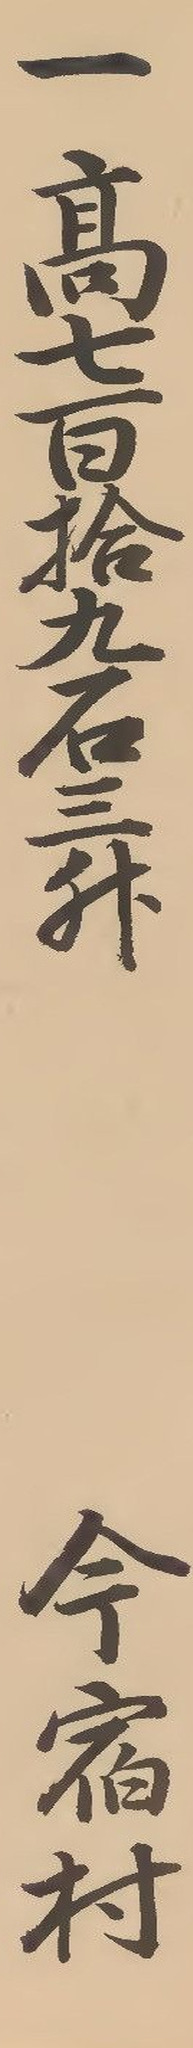一高七百拾九石三升今宿村
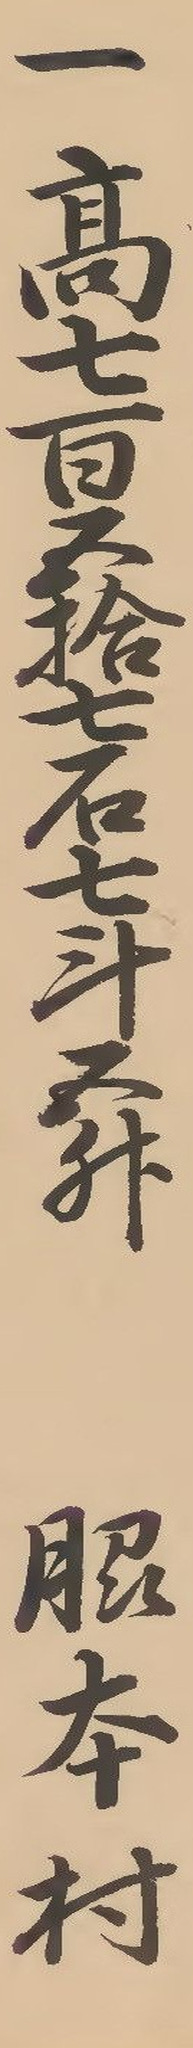一高七百五拾七石七斗五升脇本村

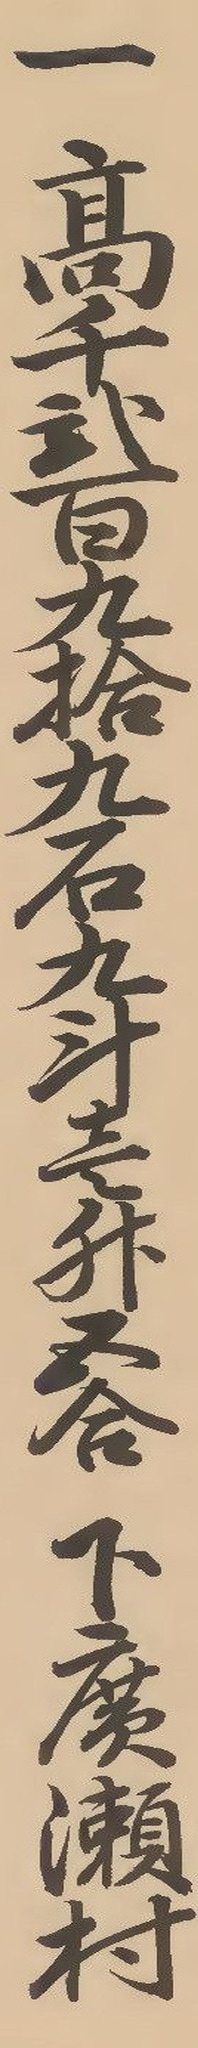一高千弐百九拾九石九斗壱升五合下広瀬村
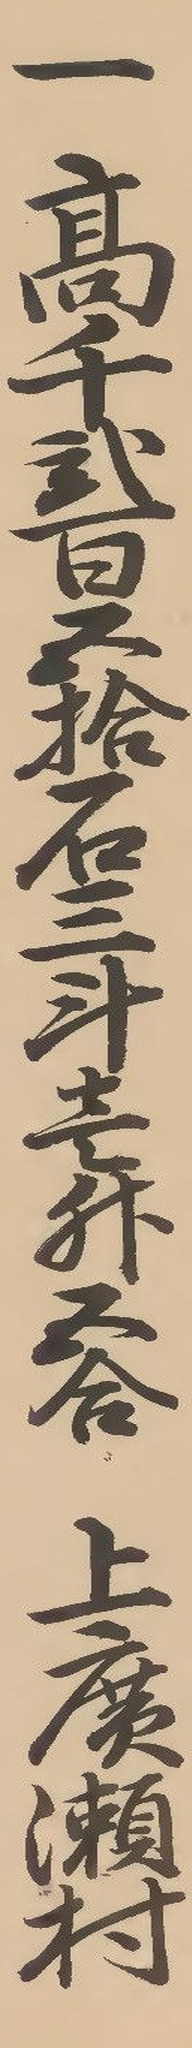一高千弐百五拾石三斗壱升五合上広瀬村
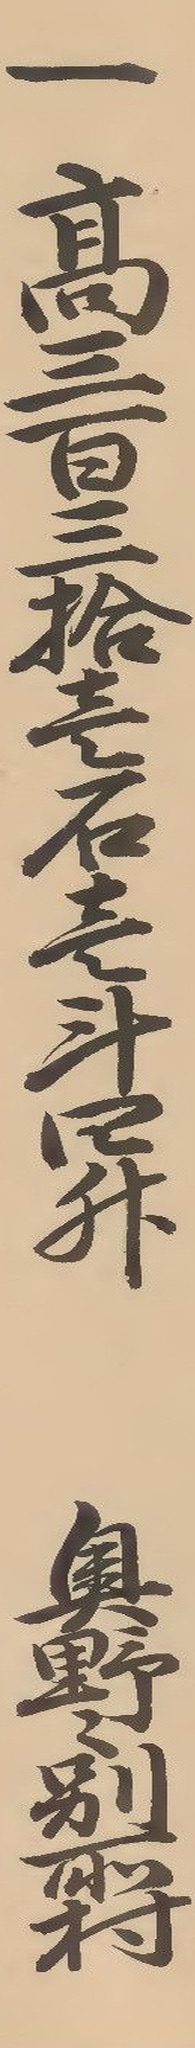一高三百三拾壱石壱斗四升奥野々別所村
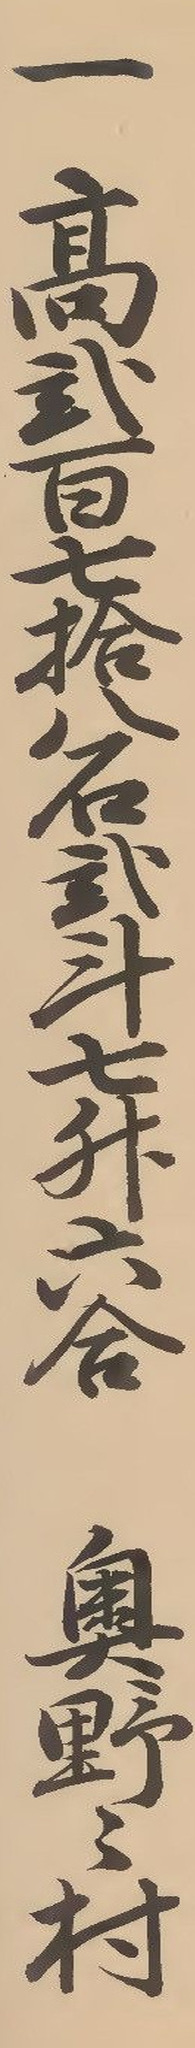一高弐百七拾八石弐斗七升六合奥野々村
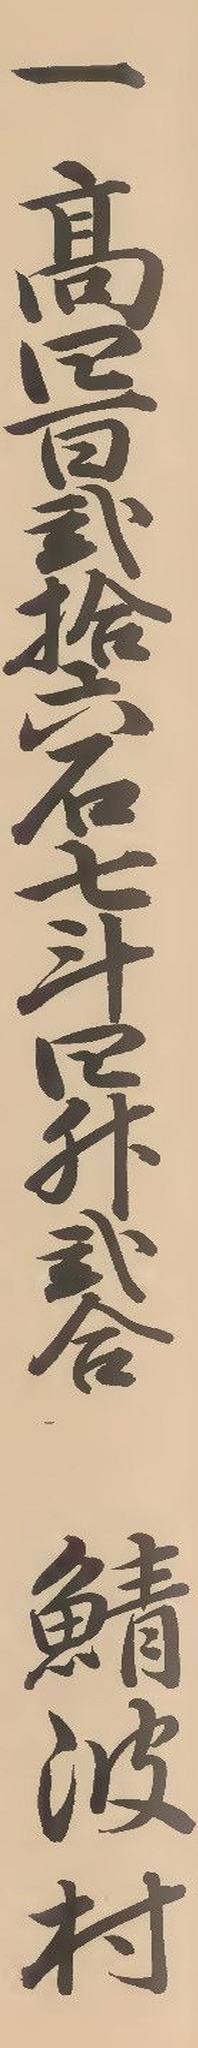一高四百弐拾六石七斗四升弐合鯖波村
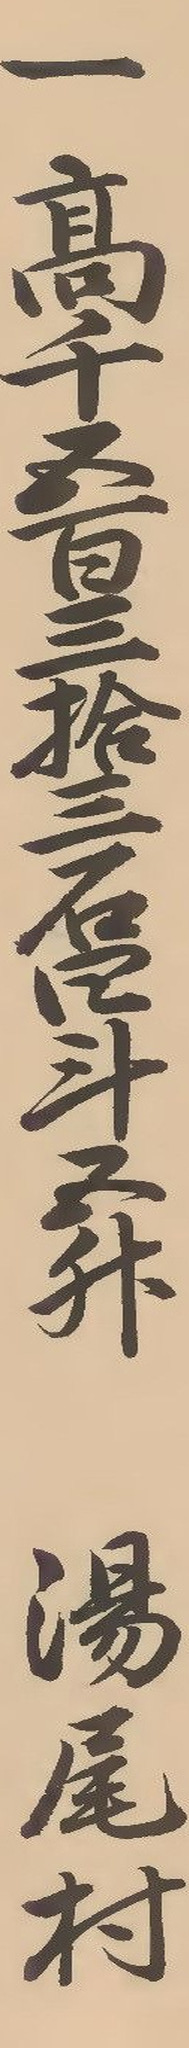一高千五百三拾三石四斗五升湯尾村
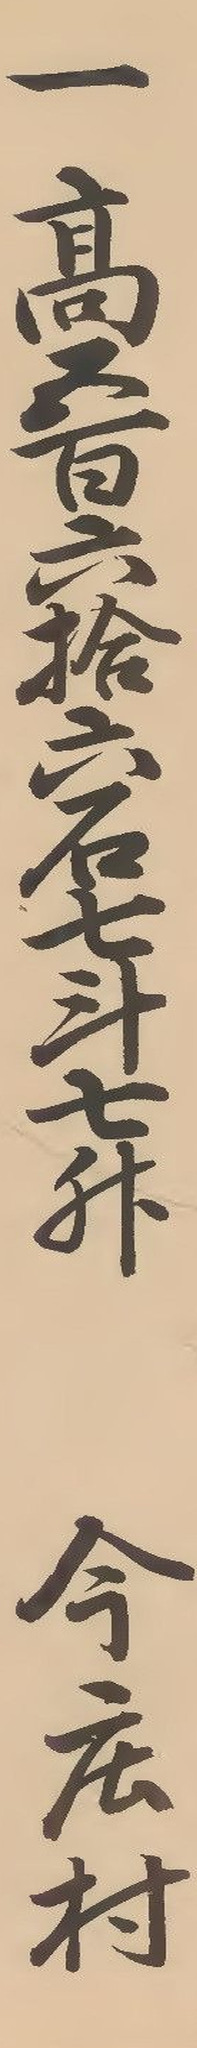一高五百六拾六石七斗七升今庄村
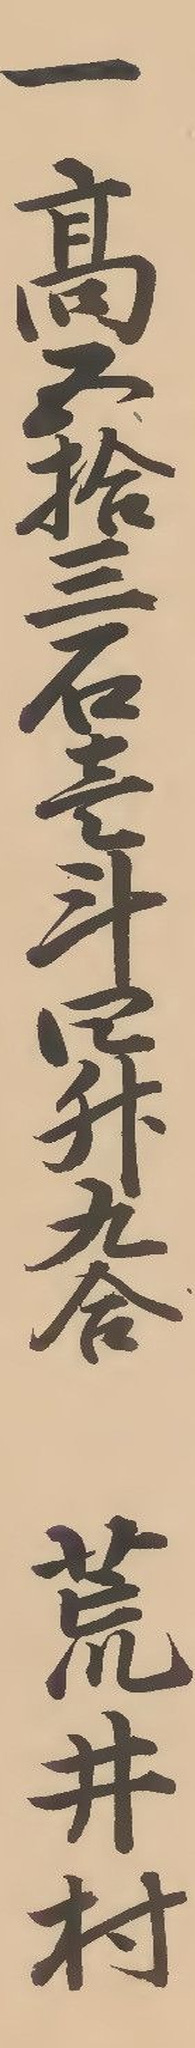一高五拾三石壱斗四升九合荒井村
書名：越前国郷帳
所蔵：国立公文書館 National Archives of Japan
